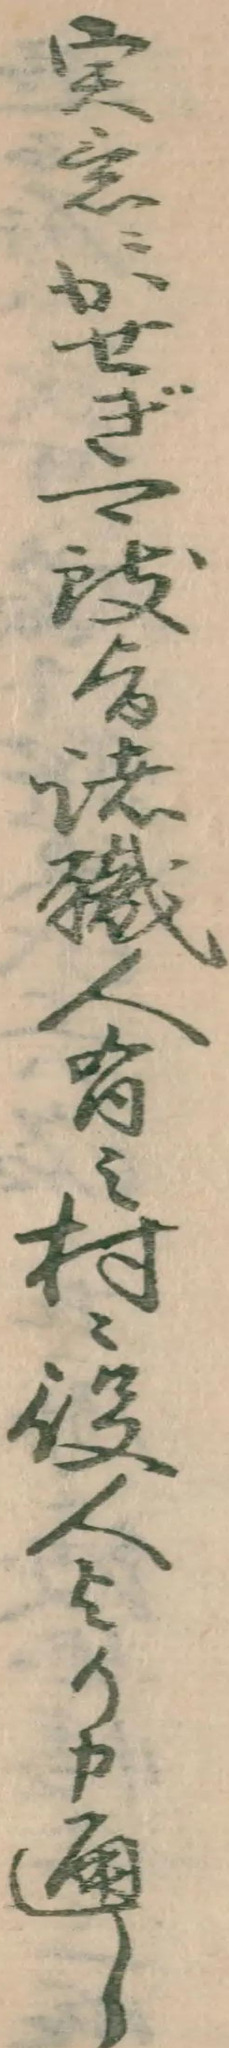実意二かせぎ可致旨諸職人有之村々役人より申通し
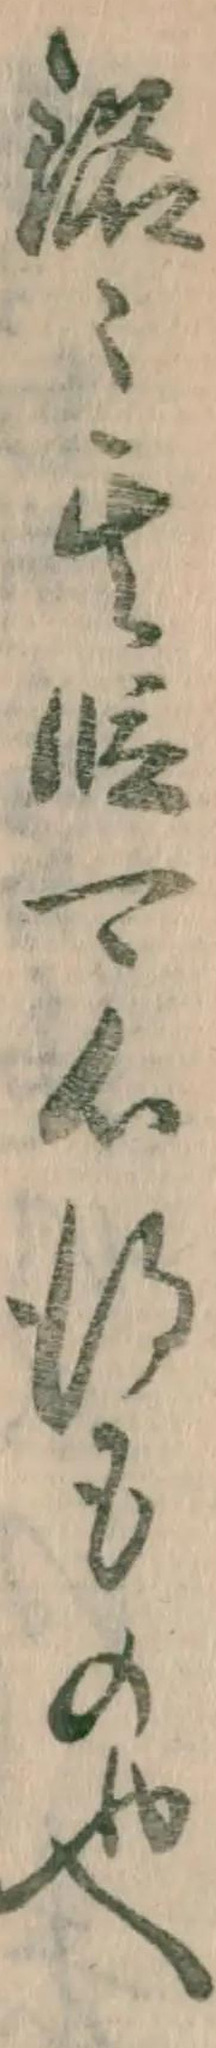銘々其の段可心得もの也
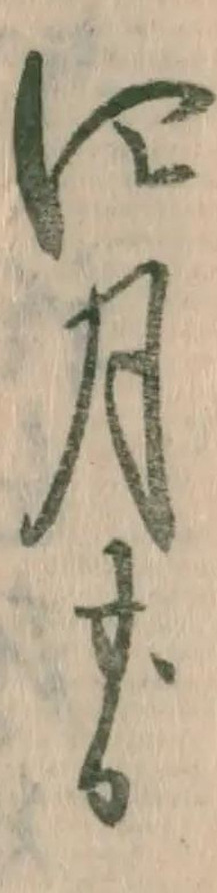四月廿日
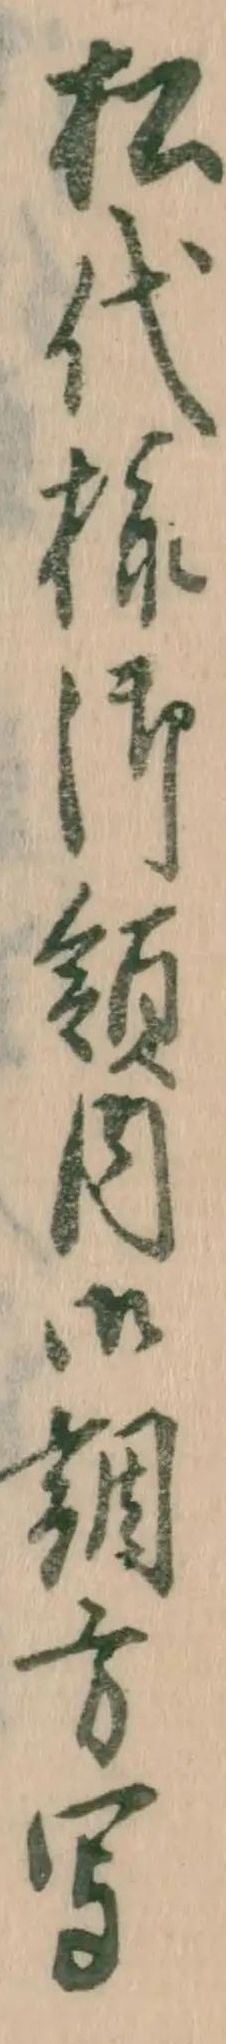松代様御領内御調方写
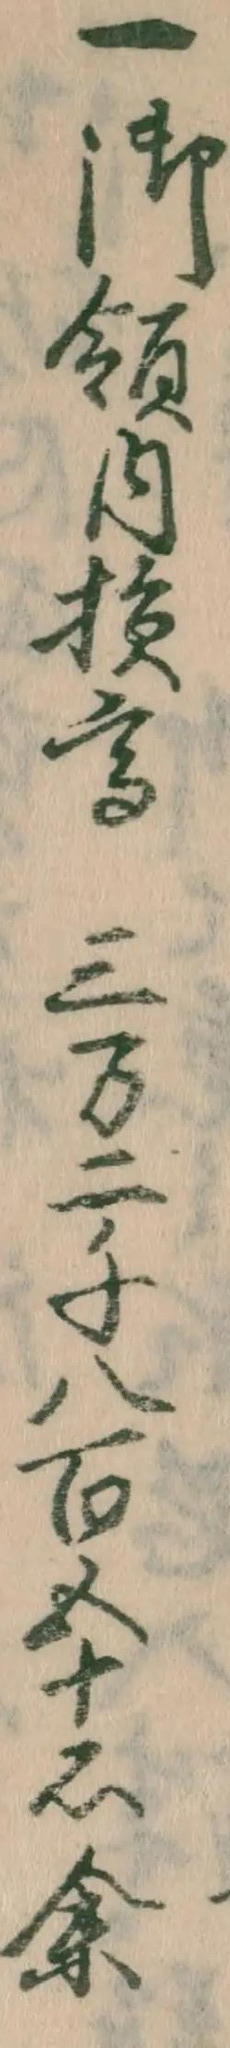一御領内損高三万二千八百五十石余
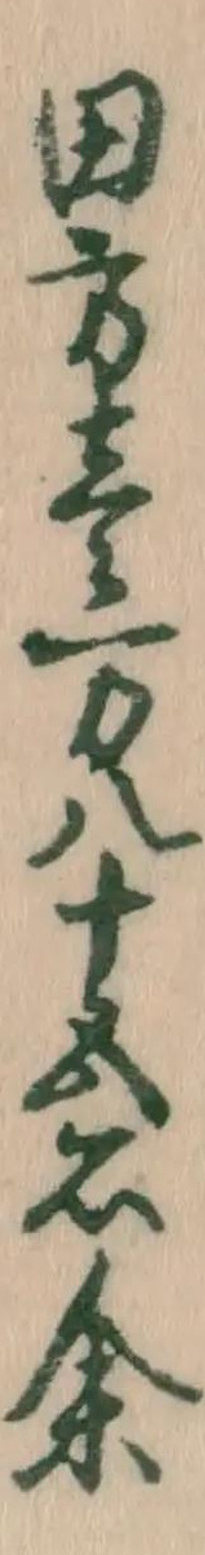内田方壱万八十五石余
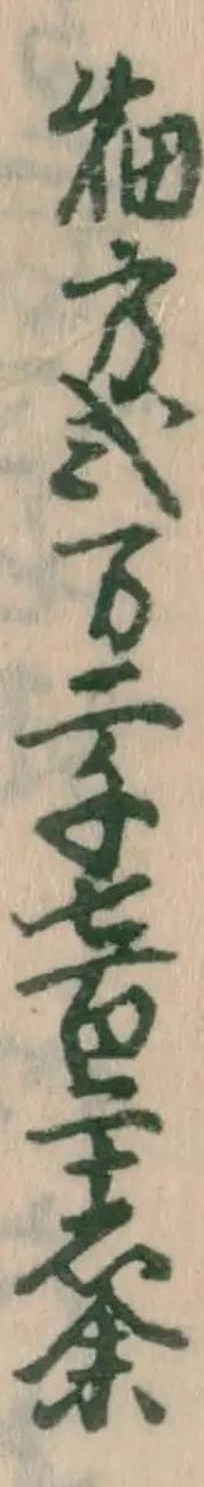畑方弐万二千七百二十石余
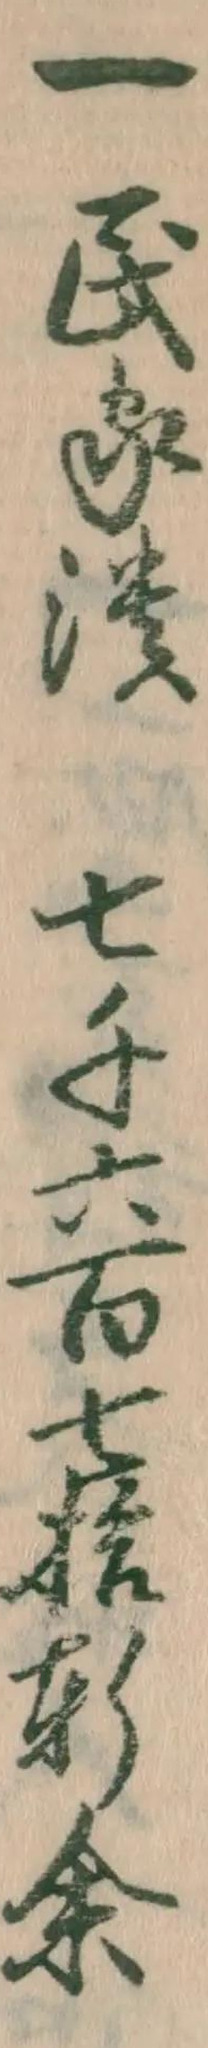一民家潰七千六百七拾軒余
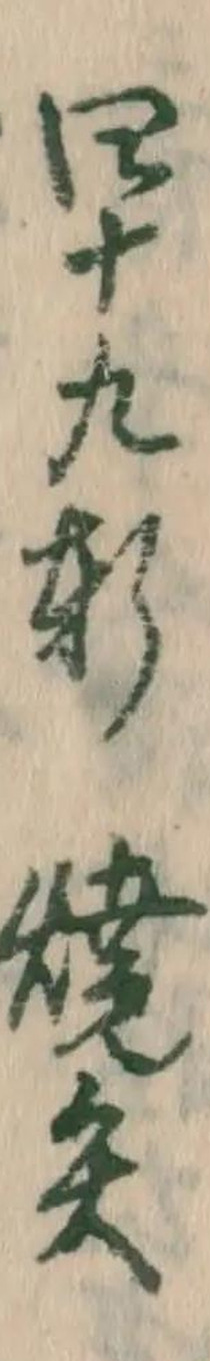四十九軒焼失
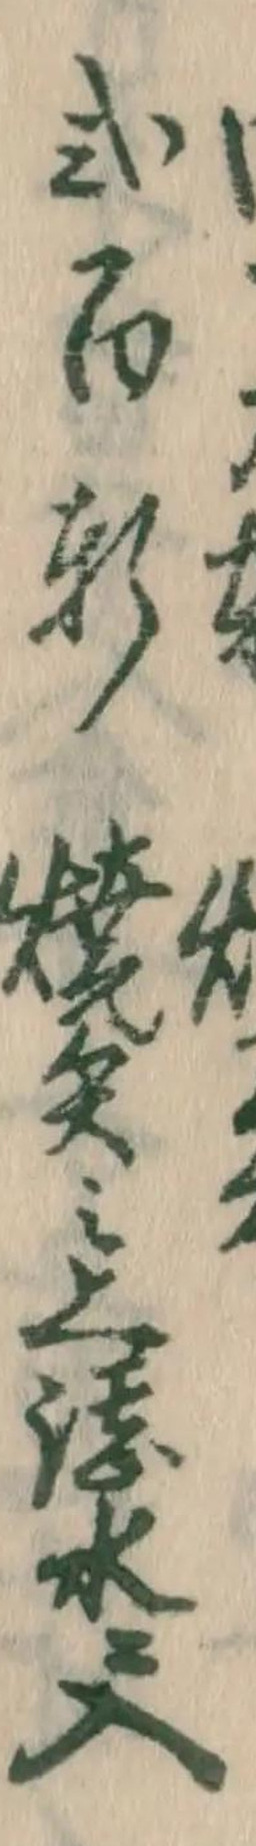弐壱百軒焼失之上湛水二入
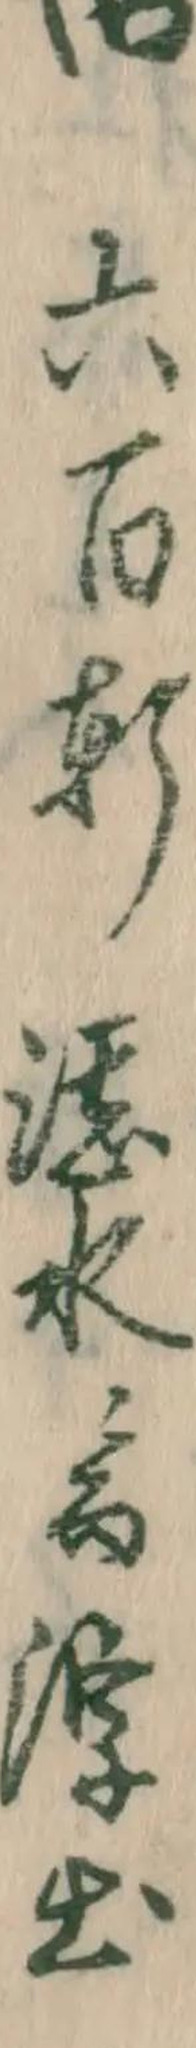内六百軒湛水二而浮出
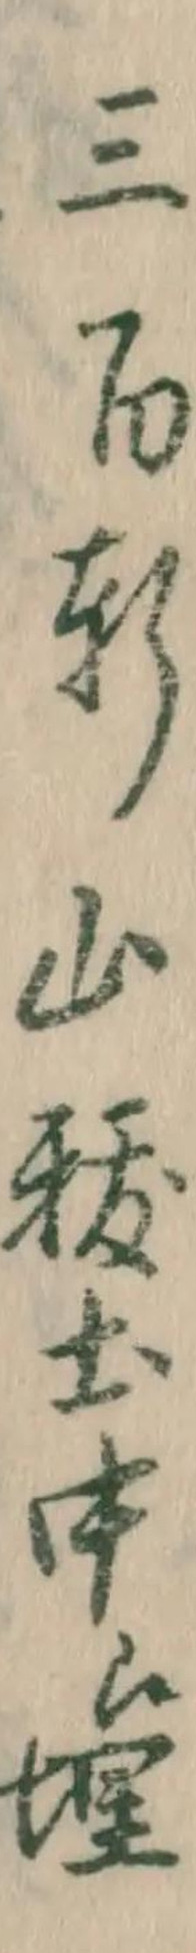三百軒山抜土中江埋
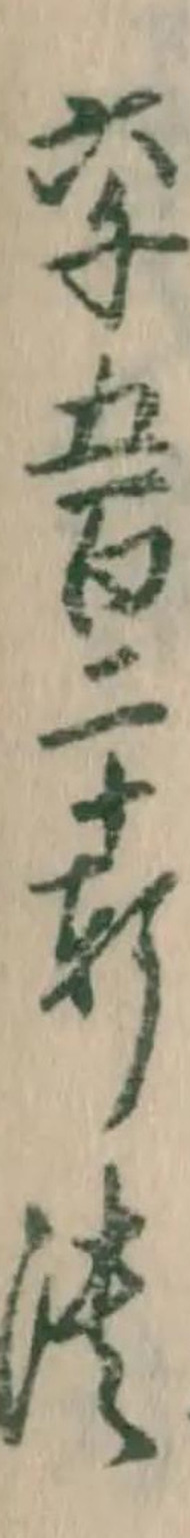六千五百二十軒潰

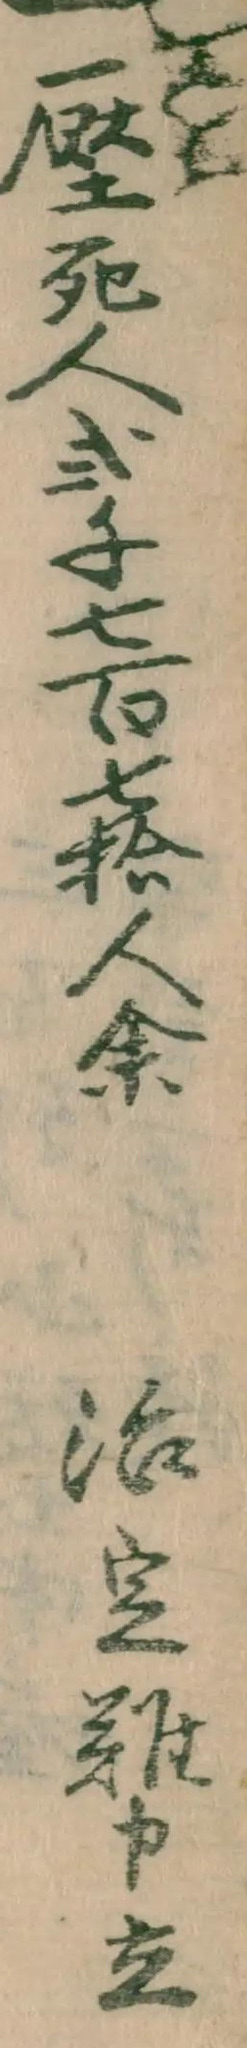一圧死人弐千七百七拾人余治定難申立
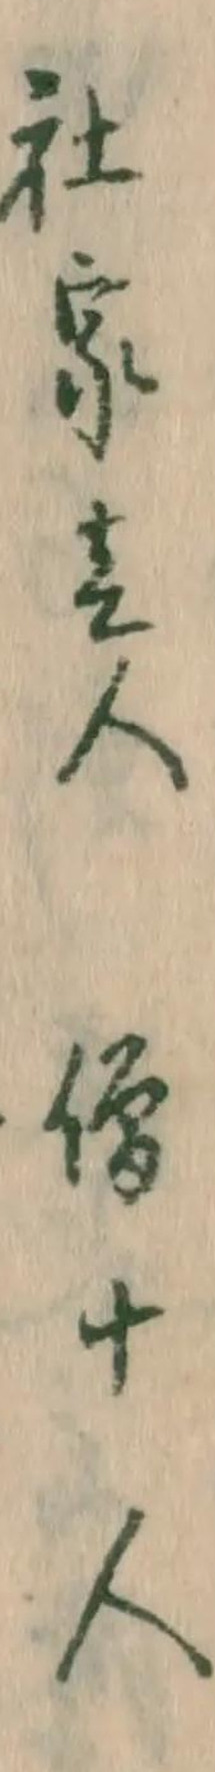社家壱人僧十人
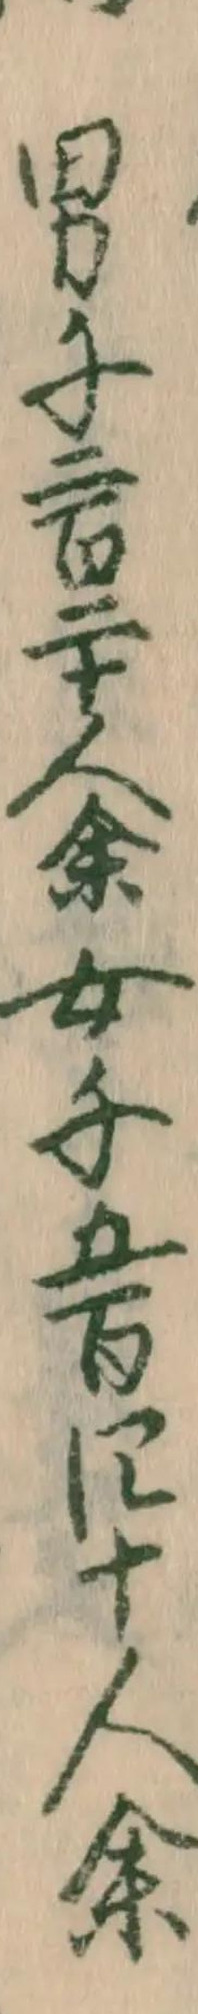内男千二百二十人余女千五百四十人余
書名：大地震
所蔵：国立国会図書館 National Diet Library, JAPAN
